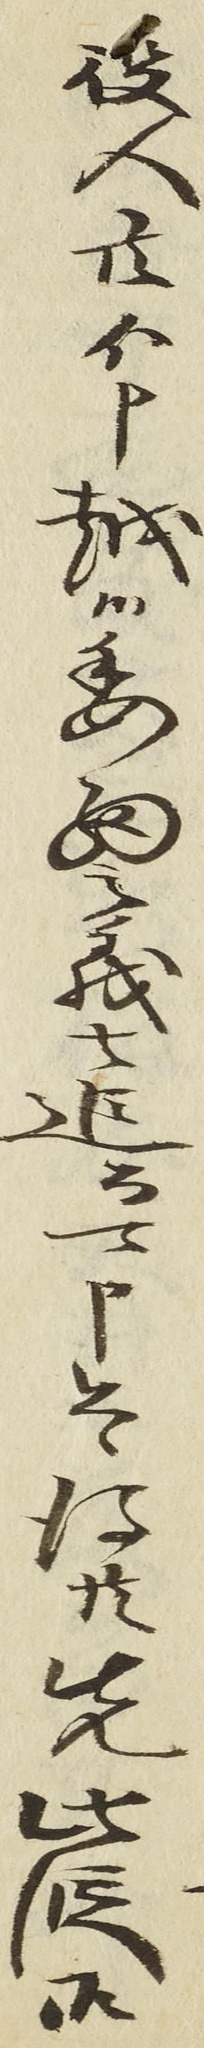役人共ゟ申越候委細之儀は追而可申上候得共先此段御
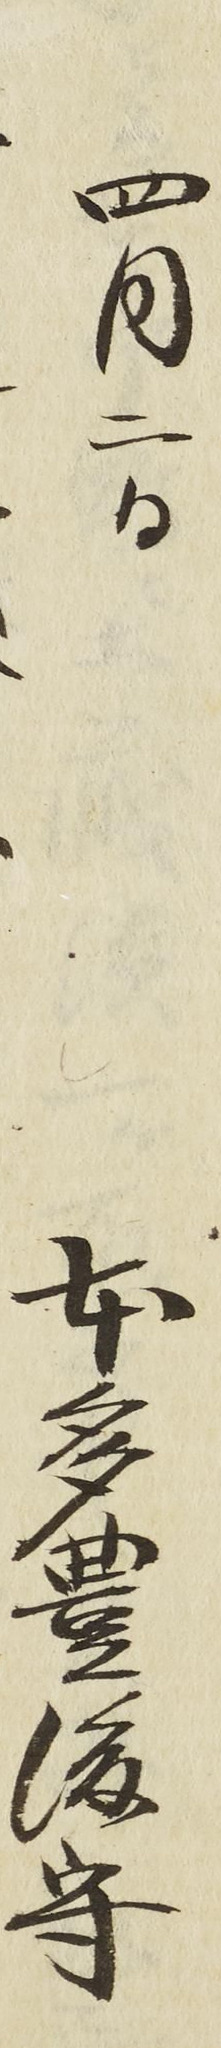四月二日本多豊後守
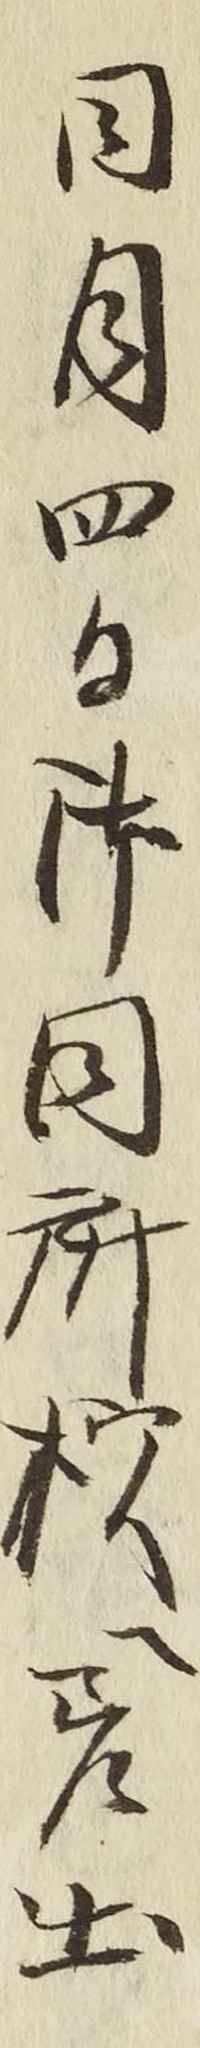同月四日御同所様へ差出
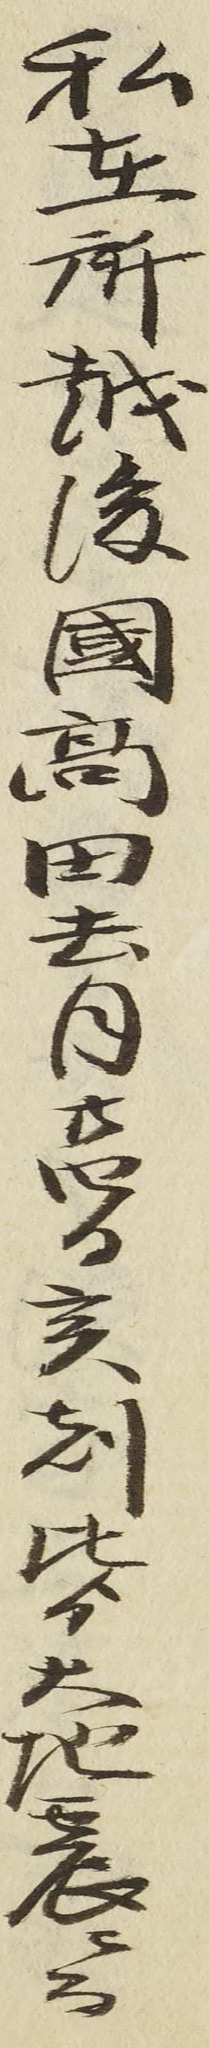私在所越後国高田去月廿四日亥刻比ゟ大地震二而
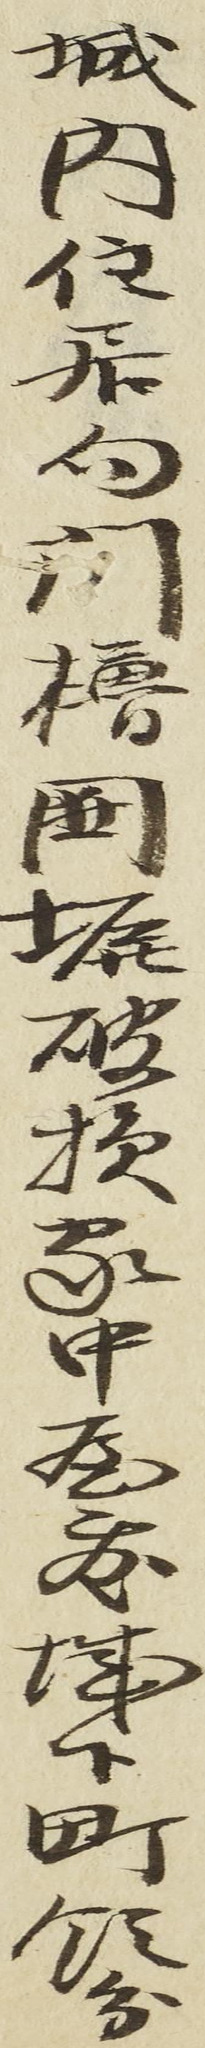城内住居向門櫓囲塀破損家中屋敷城下町領分
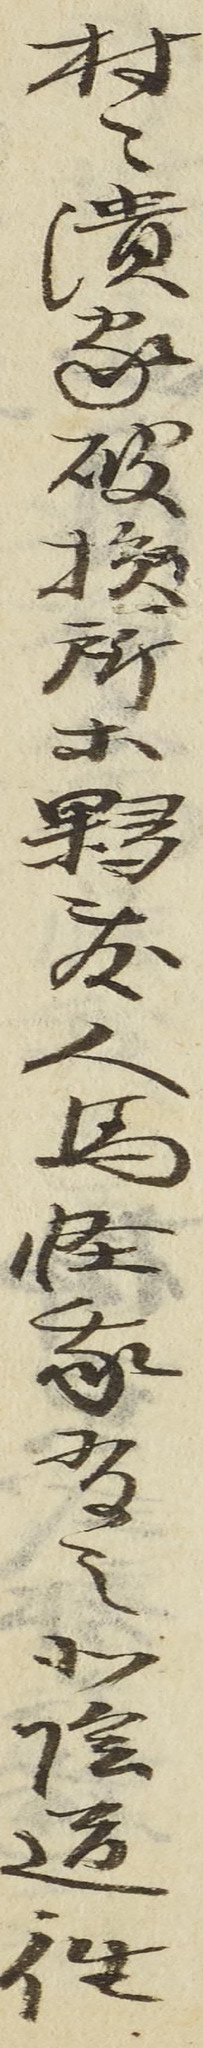村々潰家破損所等夥敷人馬怪我有之北陸道往
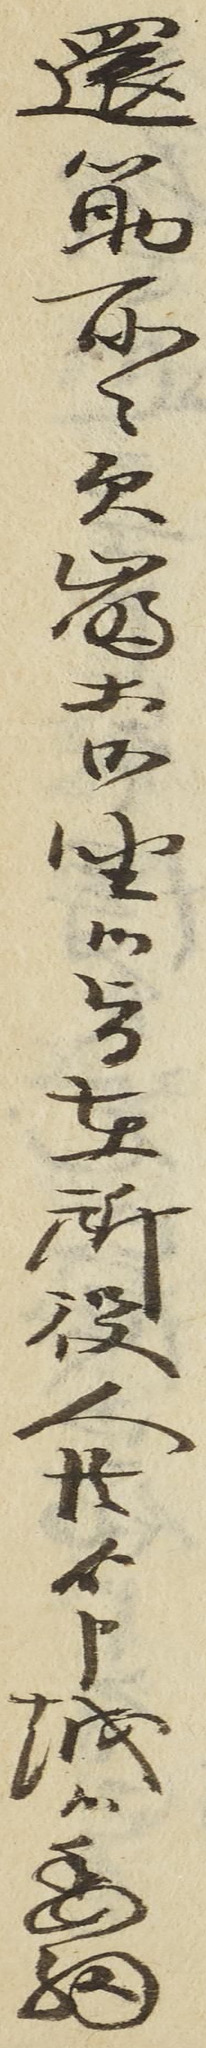還筋所々欠崩等御坐候旨在所役人共ゟ申越候委細

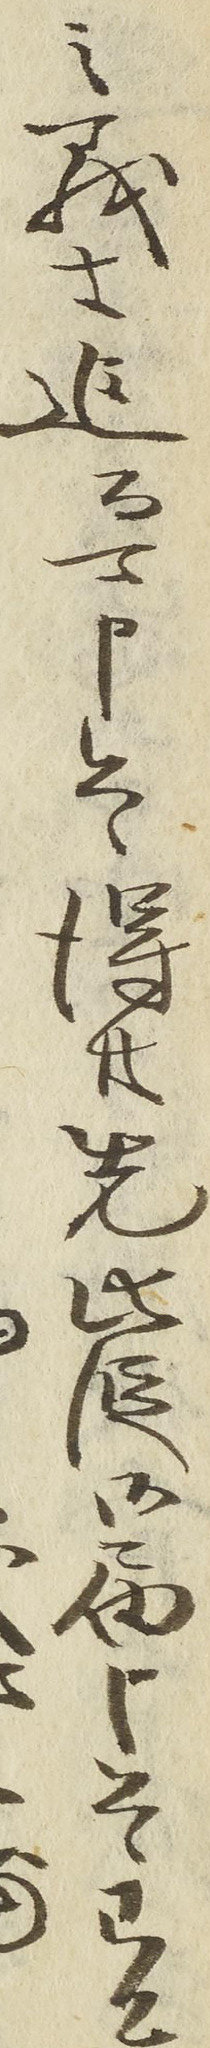之義は追而可申上候得共先此段御届申上候已上
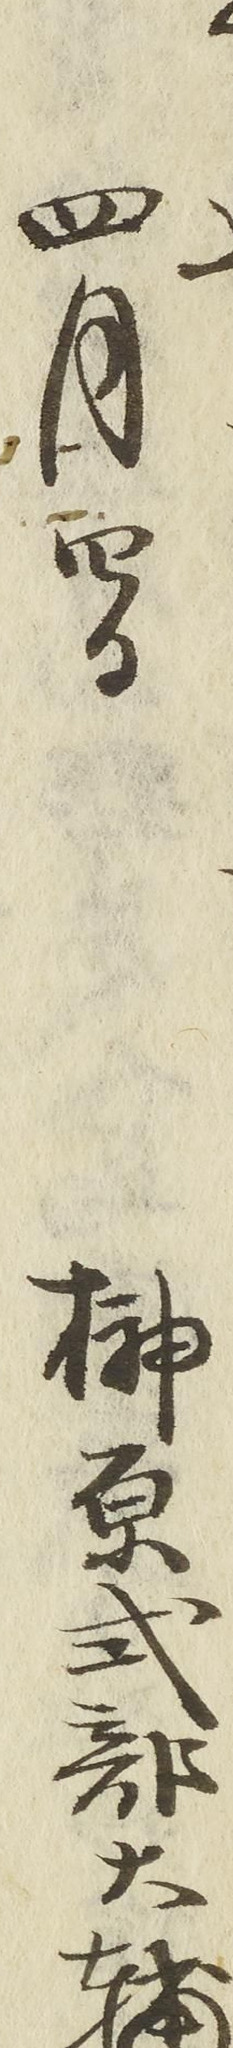四月四日榊原式部大輔
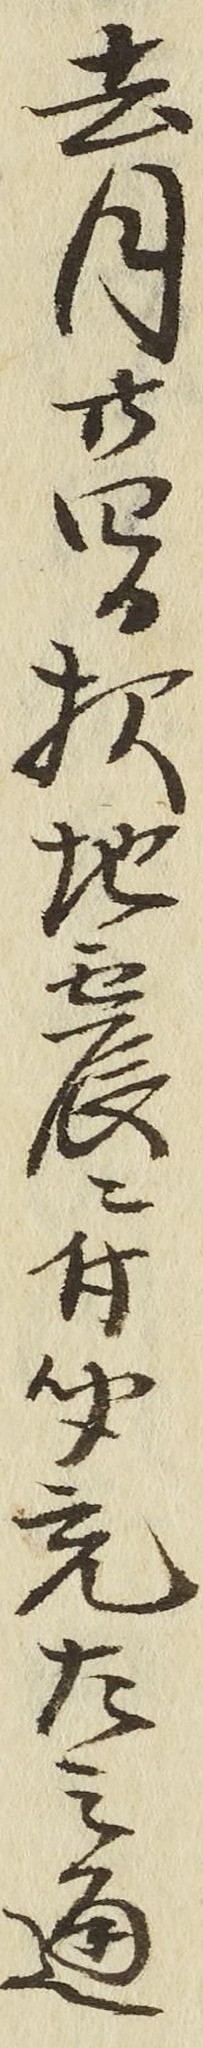去月廿四日夜地震二付聞充左之通
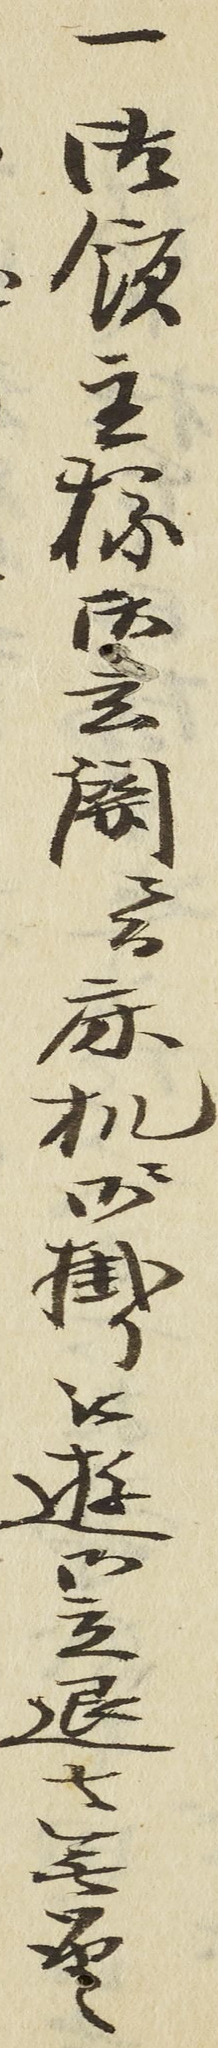一御領主様御玄関二而床机二御掛り被遊御立退は無御座候
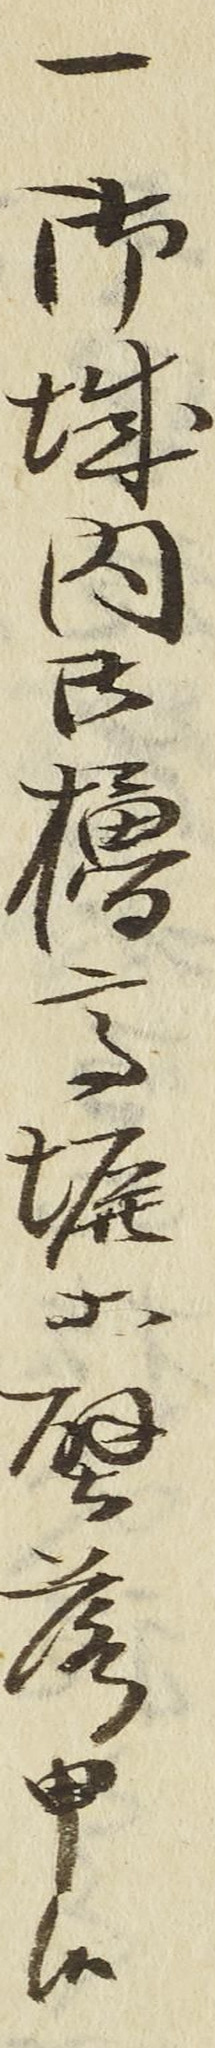一御城内御櫓高塀等壁落申候
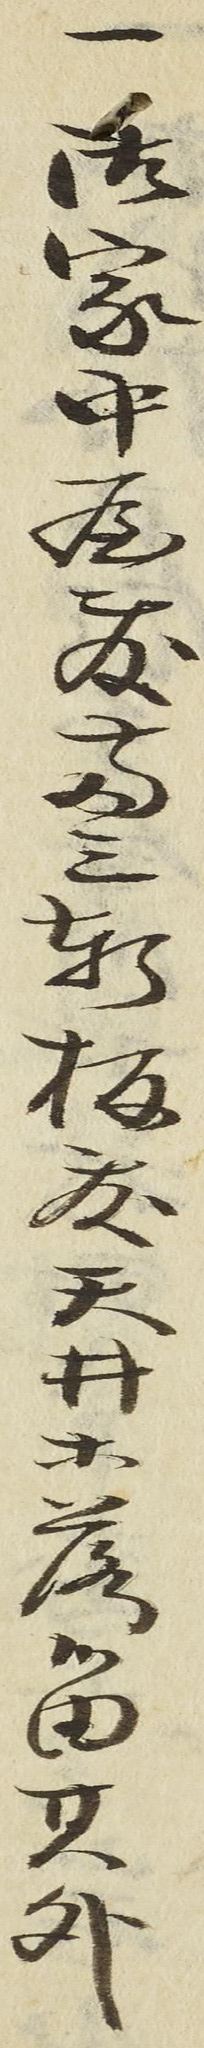一御家中屋敷両三軒板敷天井等落候由其外
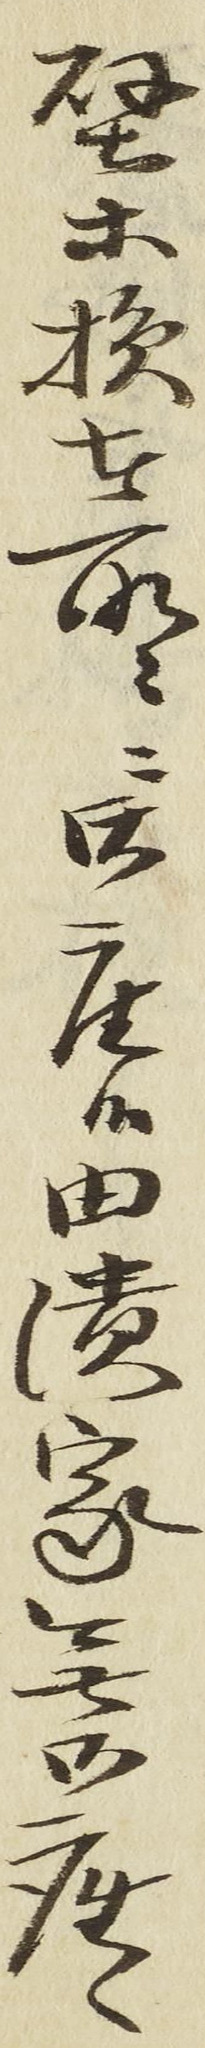壁等損は所々二御座候由潰家無御座候
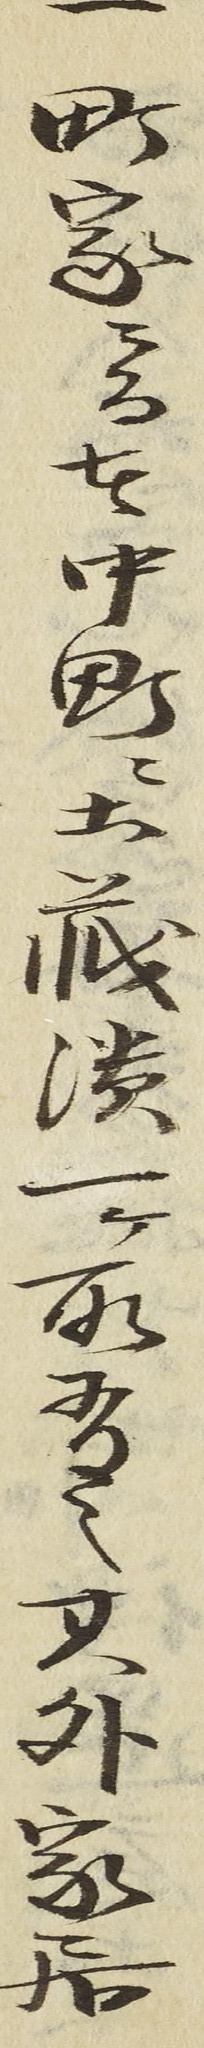一町家二而は中町二土蔵潰一ヶ所有之其外家居
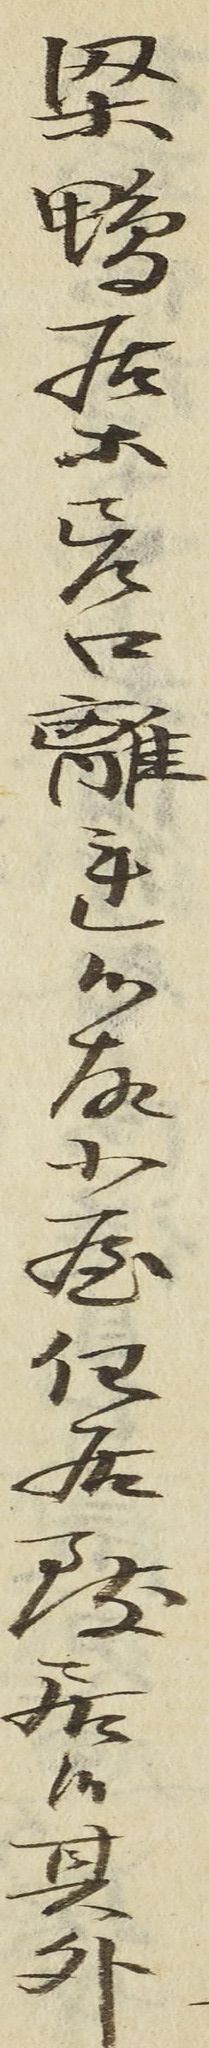梁鴨居等差口離れ候故小屋住居致居候其外
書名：信濃國大地震記　乾
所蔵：東京大学地震研究所図書室 Earthquake Research Institute Library, The University of Tokyo, JAPAN
